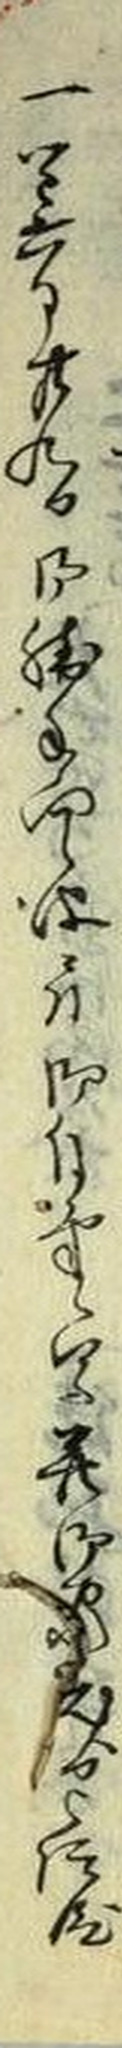一閏六月廿九日御勝手向之儀ニ付御自筆之写幷御家老ゟ被仰渡
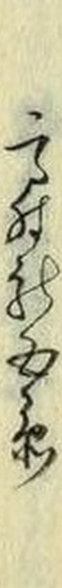高村新五兵衛江
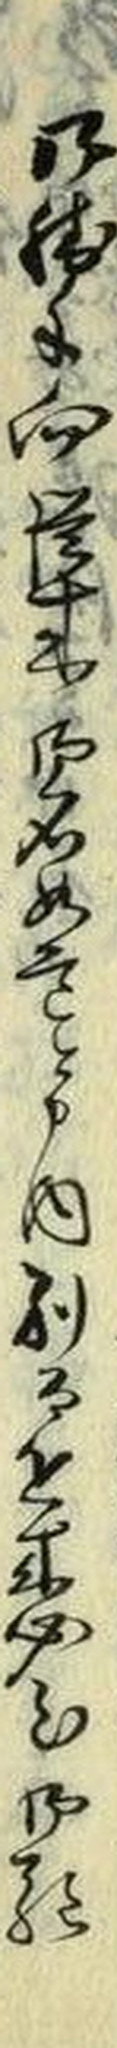御勝手向従来御不如意と申内別而近来必至御難
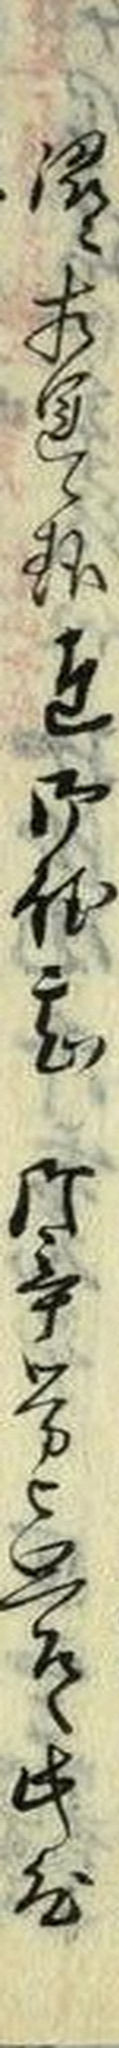渋ニ相運候趣達御聴甚御辛労被思召候此度
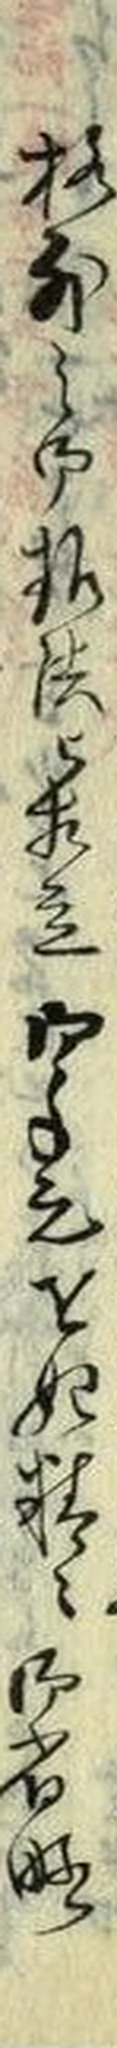格外之御趣法被相立御手元を始精々御省略
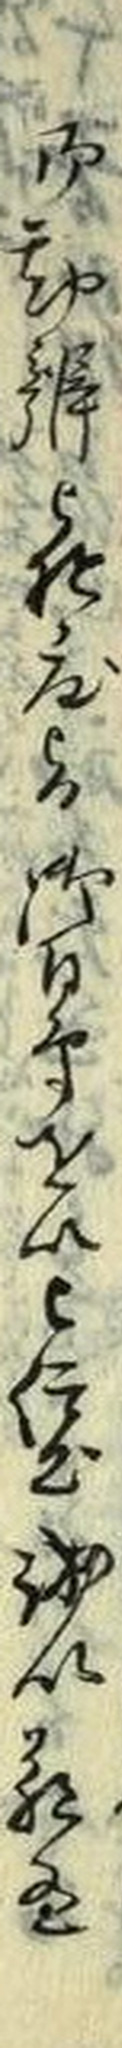御勘弁被遊度旨御自筆を以被仰出誠以難有
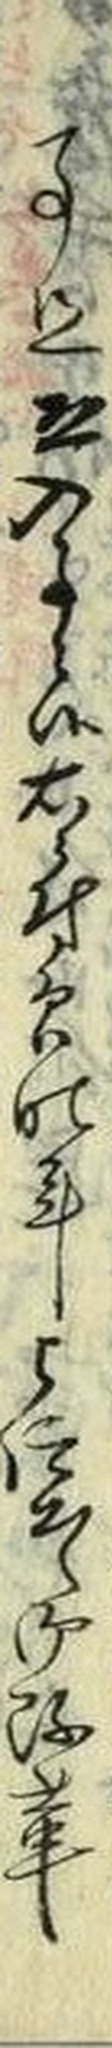事且恐入事ニ候右ニ付而ハ昨年被仰出候御改革
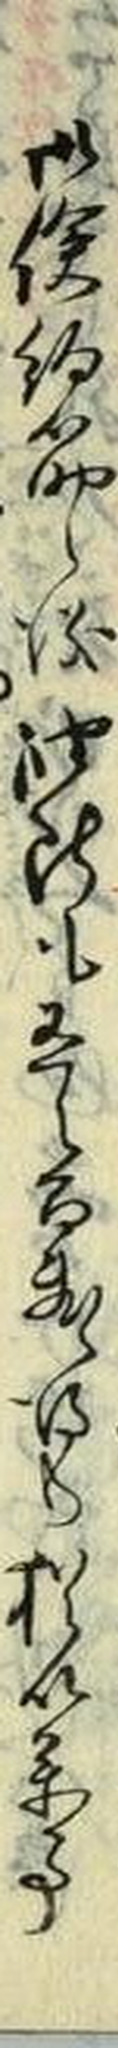御倹約筋之儀油断も有之間敷候得共猶以万事
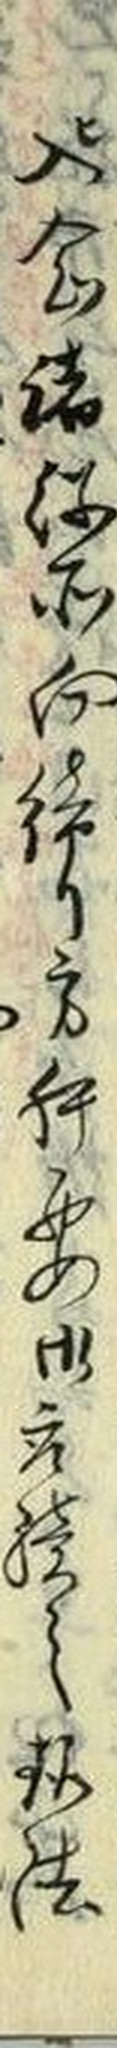被入念諸役所向締り方肝要御取続之趣法
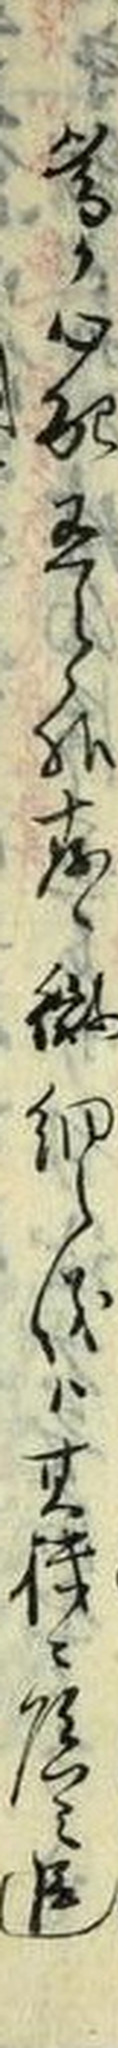篤ク心配有之候様存候微細之儀ハ其機ニ慎ミ追
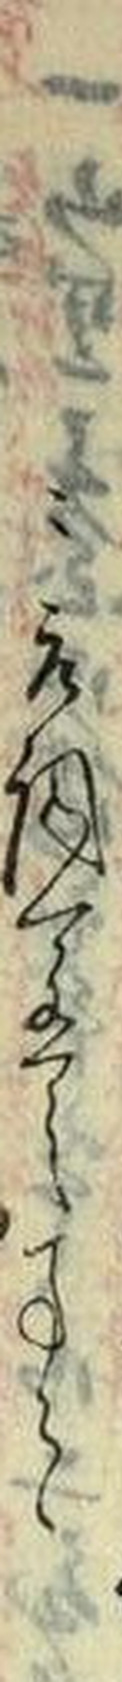々取調可有之事ニ候
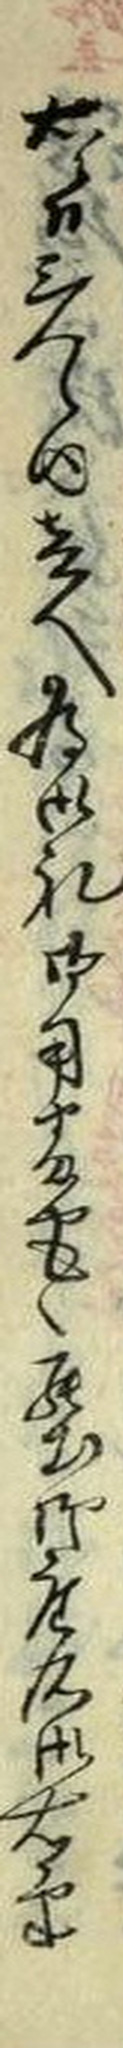右ニ付三人之内壱人為御礼御用番宅へ罷出御座所御右筆

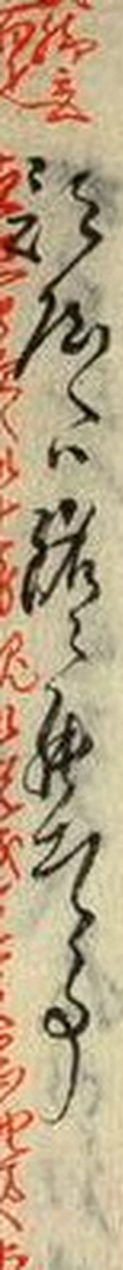部屋へハ銘々罷出候事
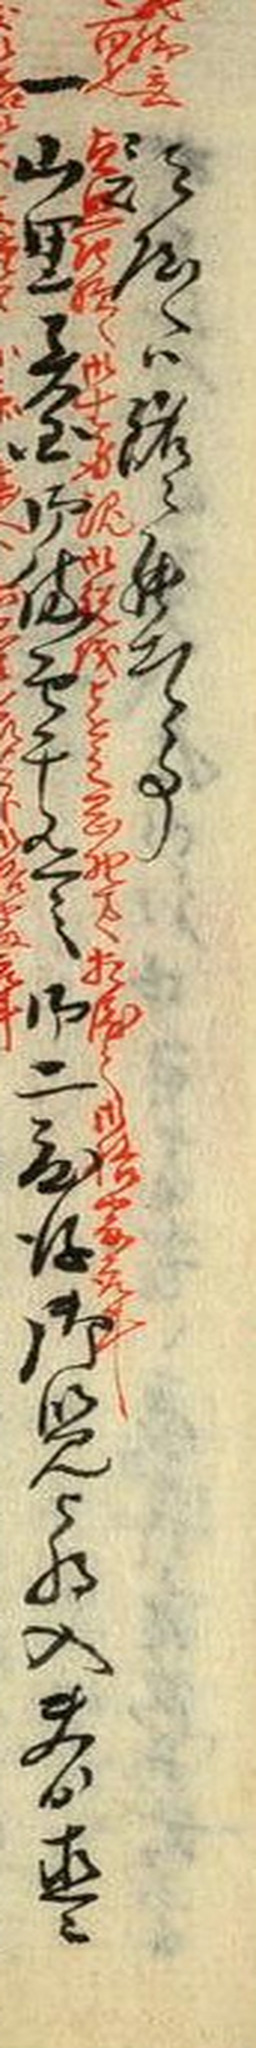一山里異国御備虫干有之御二度後御覧被為入夫ゟ直ニ
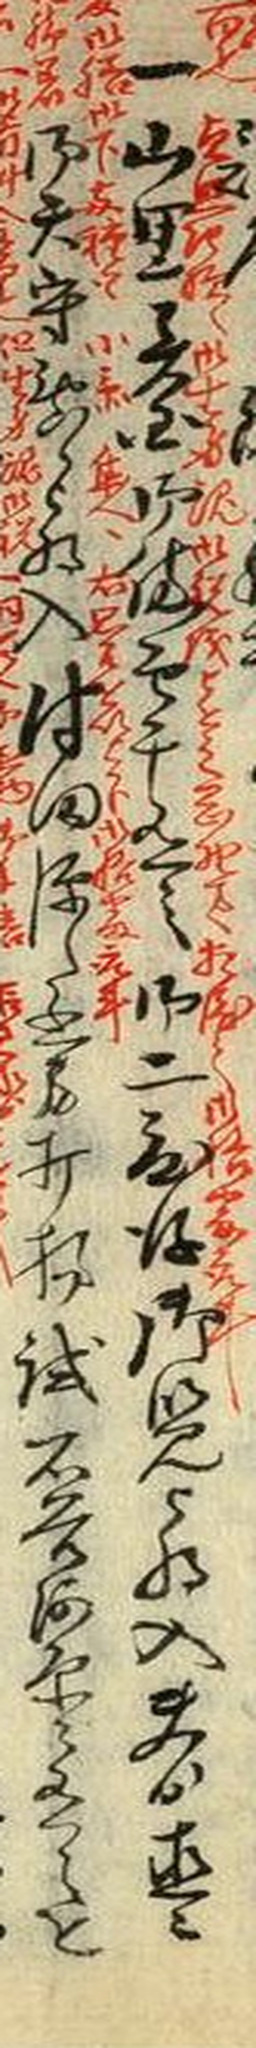御天守台へ被為入津田源之丞方打揚試石谷河原ニ有之を
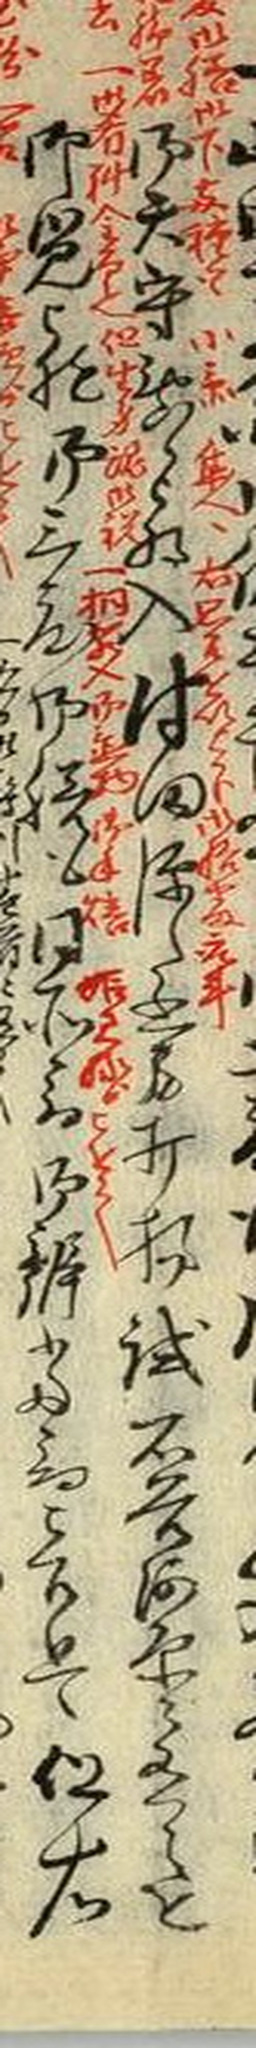御覧被遊御三度御膳も同所ニ而御弁当ニ而被召上候但右
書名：少傅日録抄（斉承付側向頭取日記、在国）
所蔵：福井県文書館 Fukui Prefectural Archives
